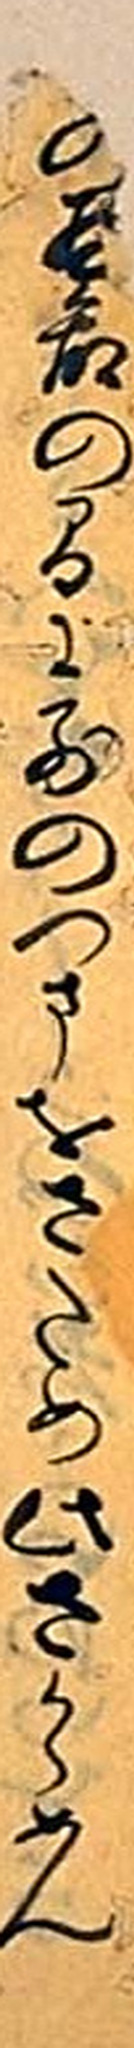の存命の間に別のつまをさため此さからめん
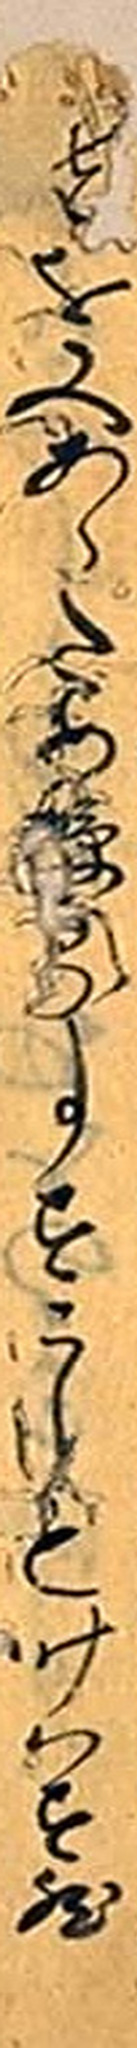とを又あらため授る事すこしも叶はす然
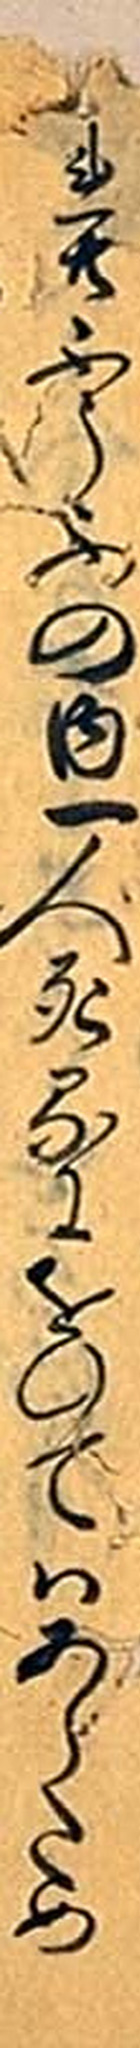れ共ふうふの内一人死るにをひてはあらため
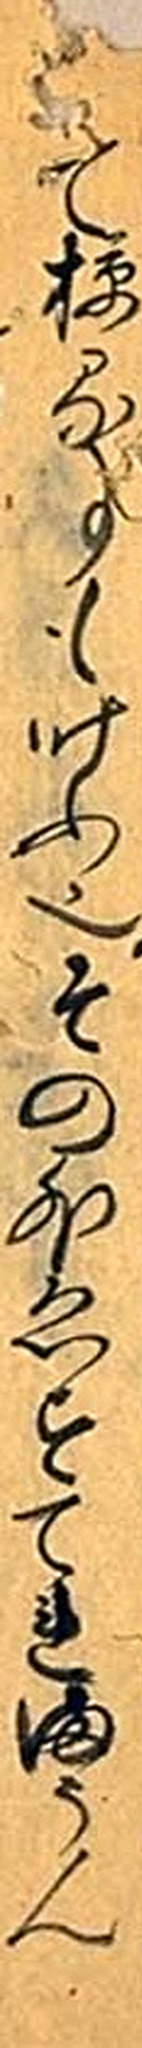て授る事も叶ふ也その外ゑすてれまうん
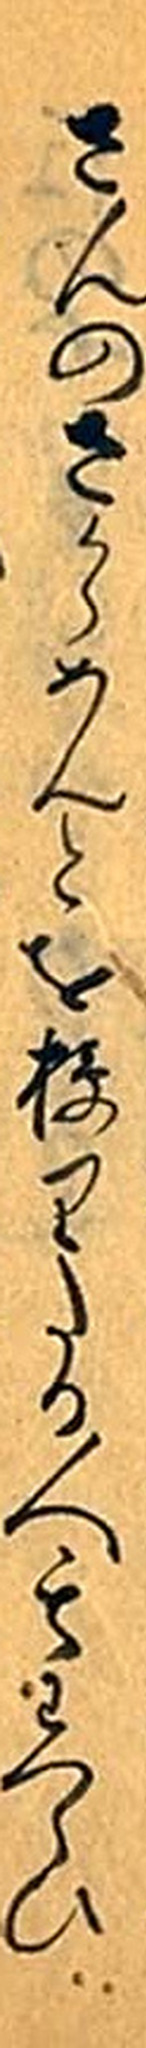さんのさからめんとを授りたる人其わつらひ
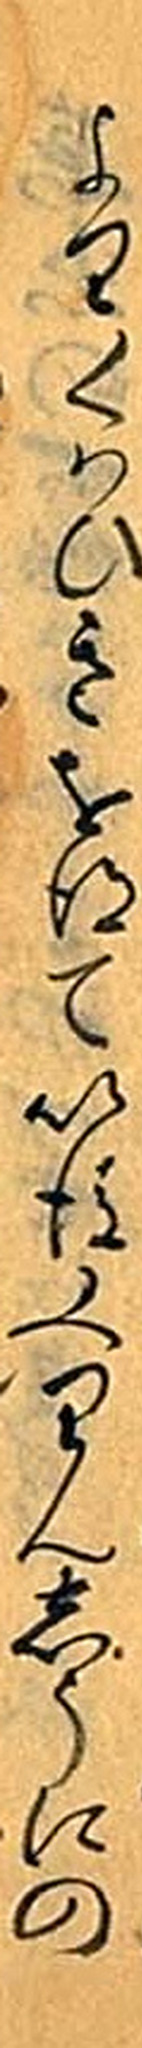よりくはひきを得て以後又りんしうにの
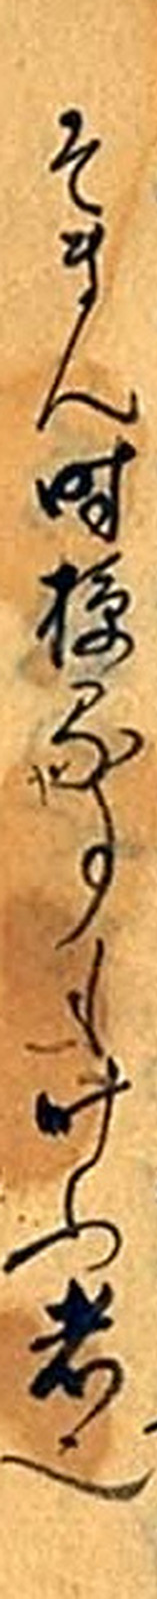そまん時授る事も叶ふ者也
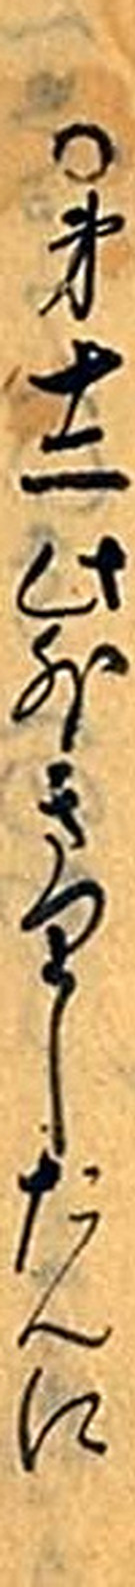○第十二此外きりしたんに
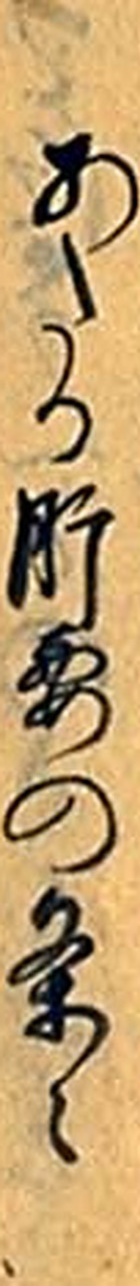あたる肝要の条々
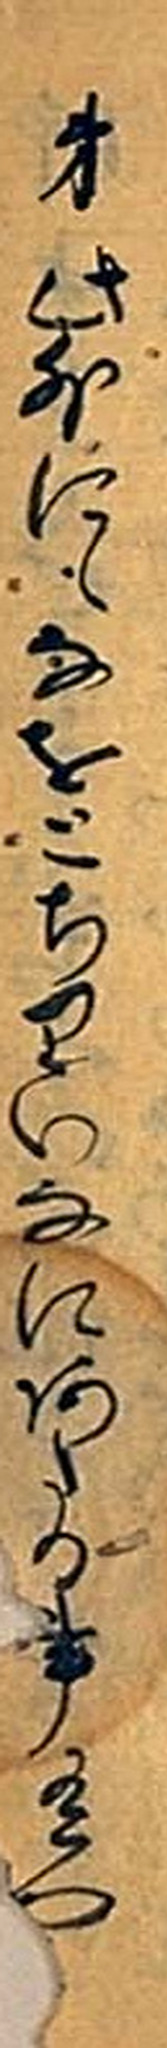弟此外にもなをとちりいなにあたる事有や

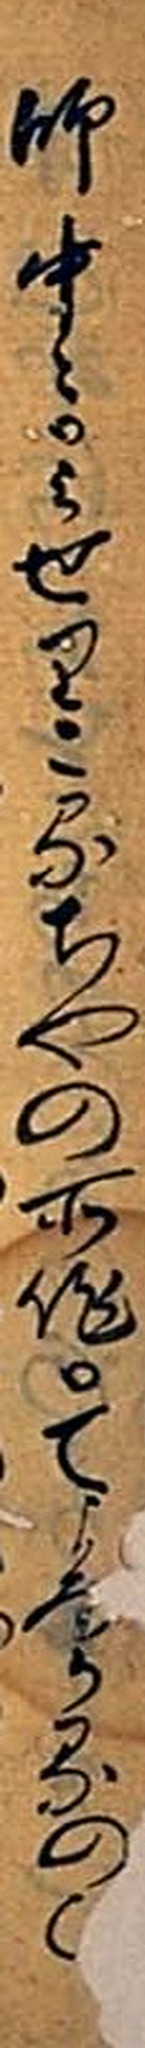師中々◦みせりこるちやの所作◦てよろかるひ
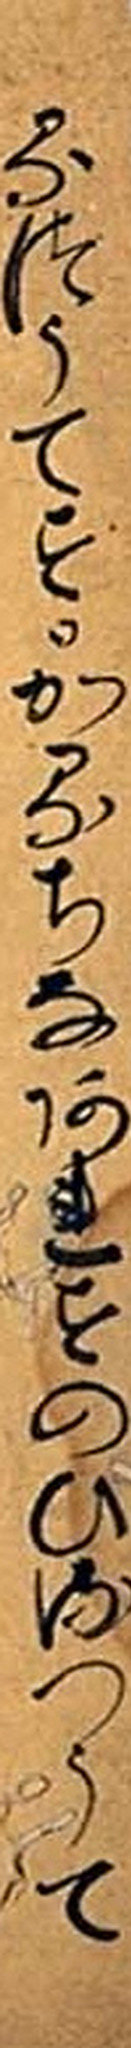るつうてす◦かるちなあれすのひるつうて
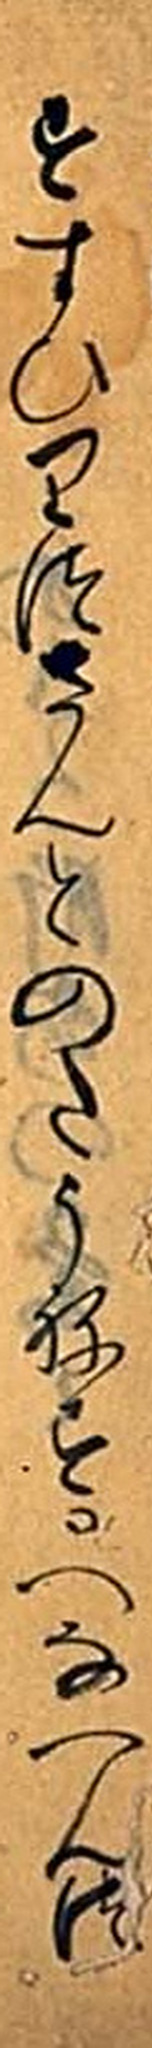すすひりつさんとのたうねす◦へなへんつ
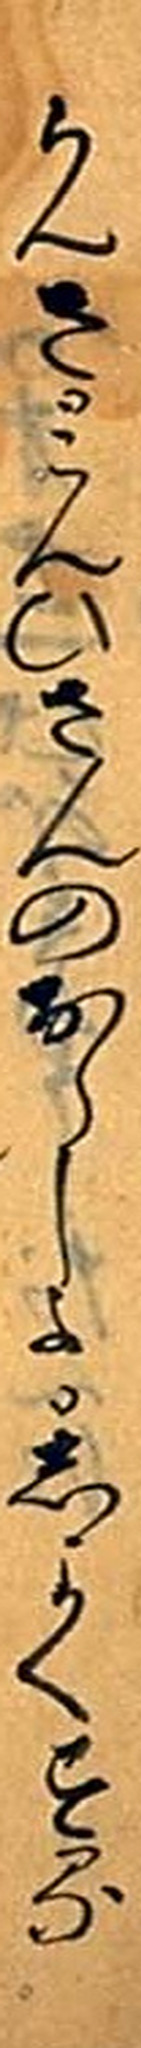らんさ◦こんひさんのおらしよ◦しよくする
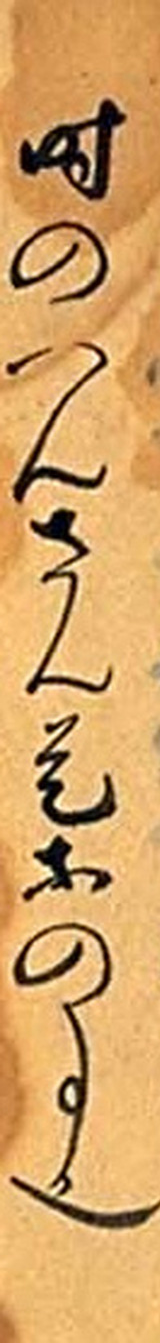時のへんさん是等の事也
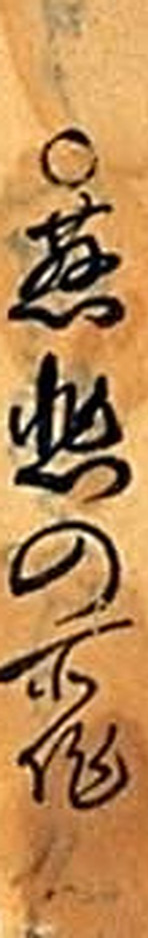○慈悲の所作
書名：ドチリナ・キリシタン
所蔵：東京大学総合図書館 / General Library in the University of Tokyo
